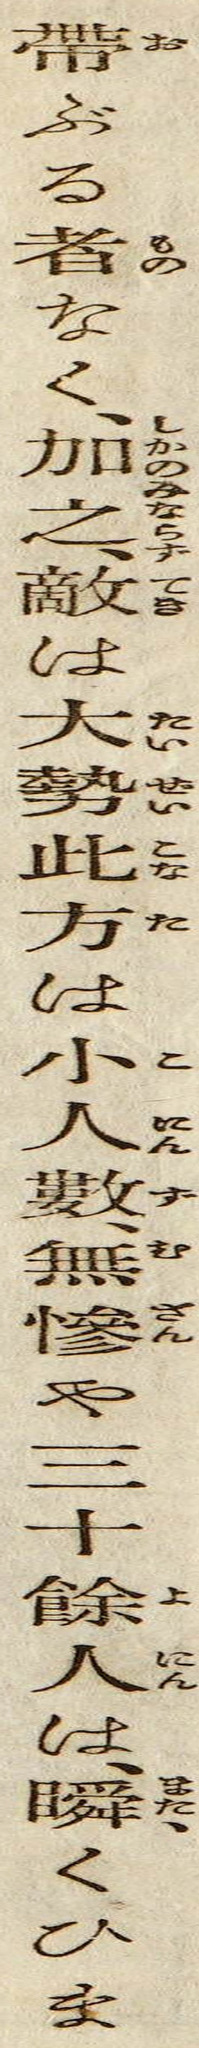帯ぶる者なく、加之、敵は大勢此方は小人数、無惨や三十余人は、瞬くひま
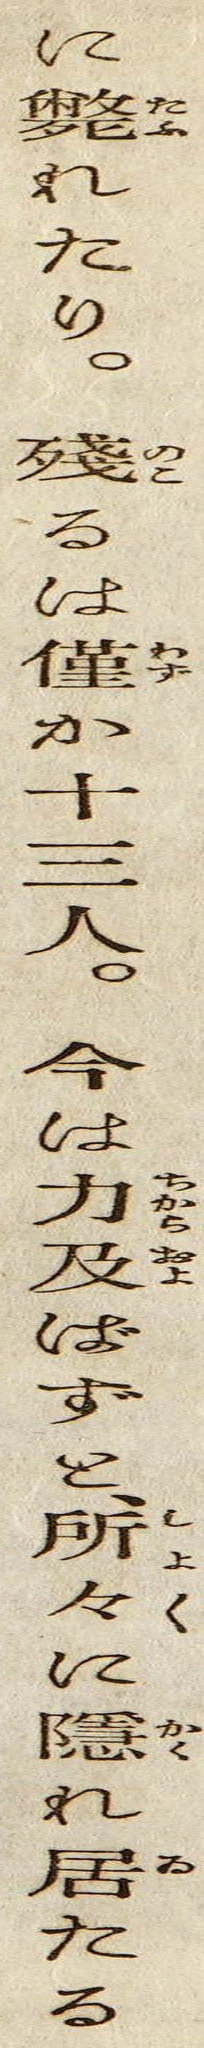に斃れたり。残るは僅か十三人。今は力及ばずと、所々に隠れ居たる
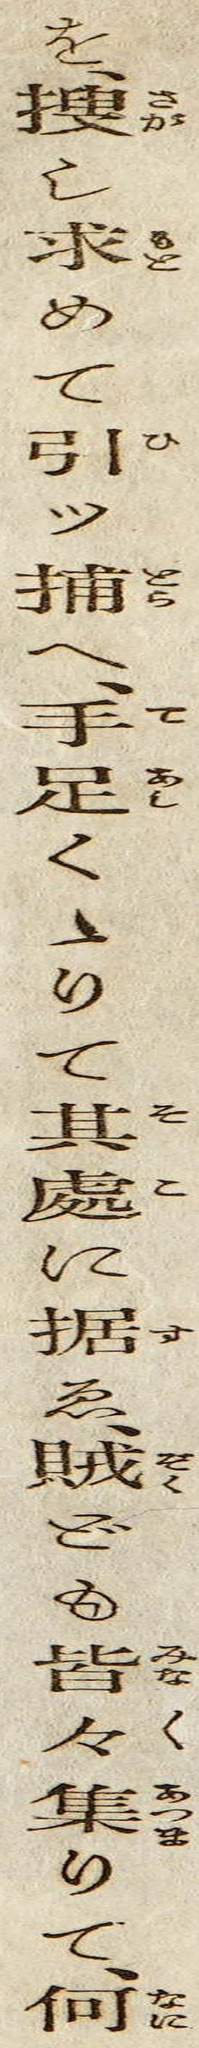を、捜し求めて引ツ捕へ、手足くゝりて其処に据ゑ、賊ども皆々集りて、何
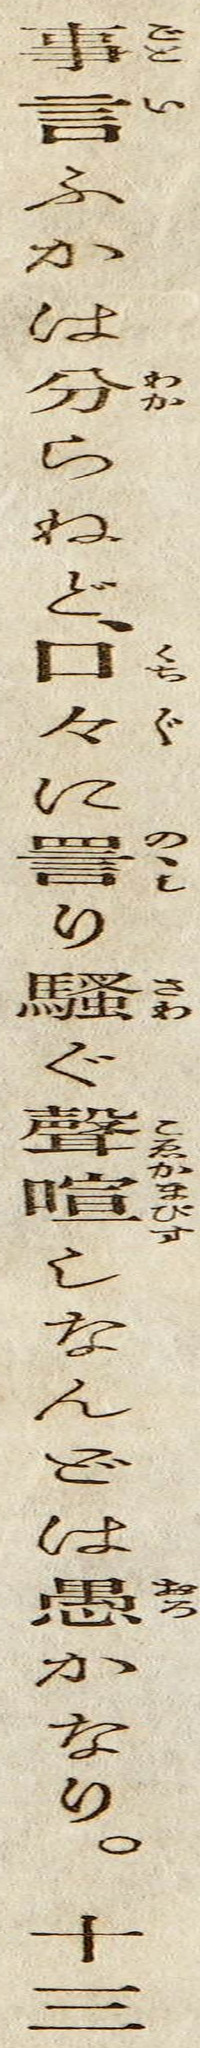事言ふかは分らねど、口々に詈り騒ぐ声喧しなんどは愚かなり。十三
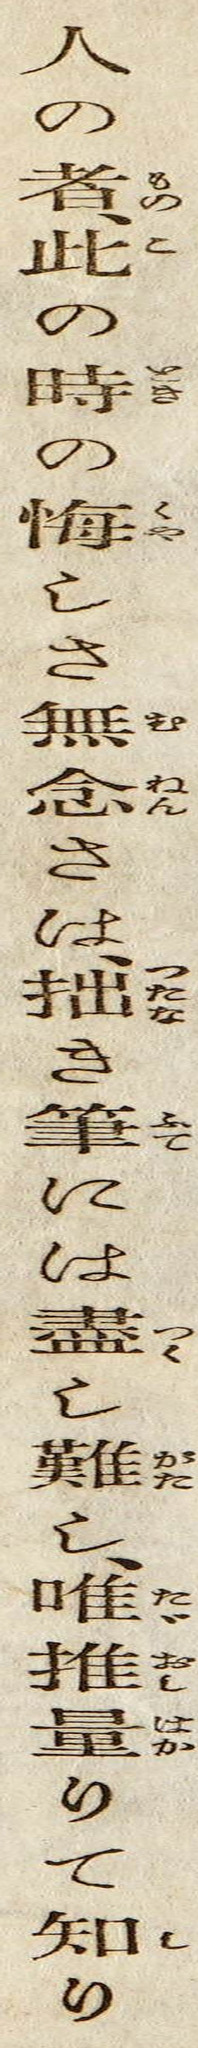人の者、此の時の悔しさ無念さは、拙き筆には尽し難し、唯推量りて知り
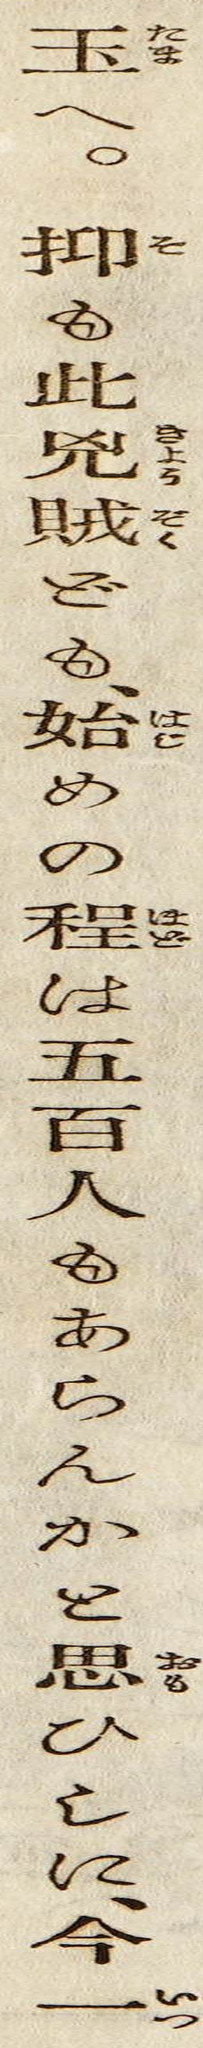玉へ。抑も此兇賊ども、始めの程は五百人もあらんかと思ひしに、今一
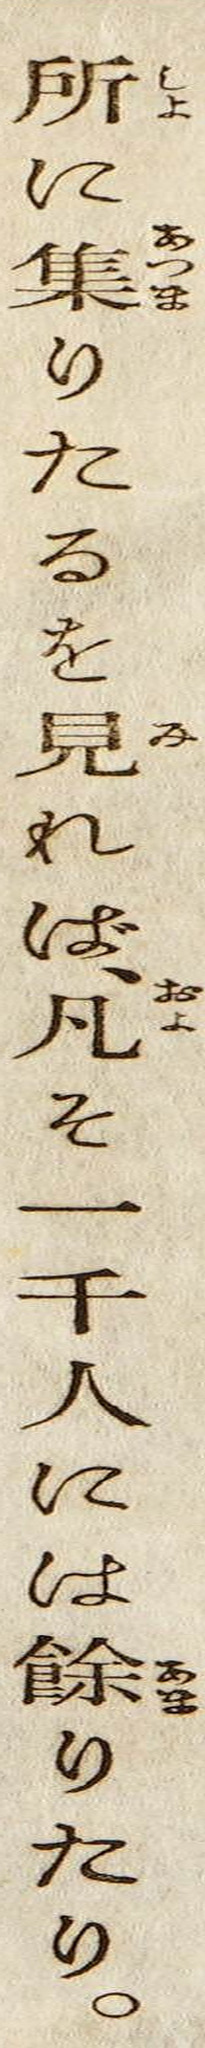所に集りたるを見れば、凡そ一千人には余りたり。
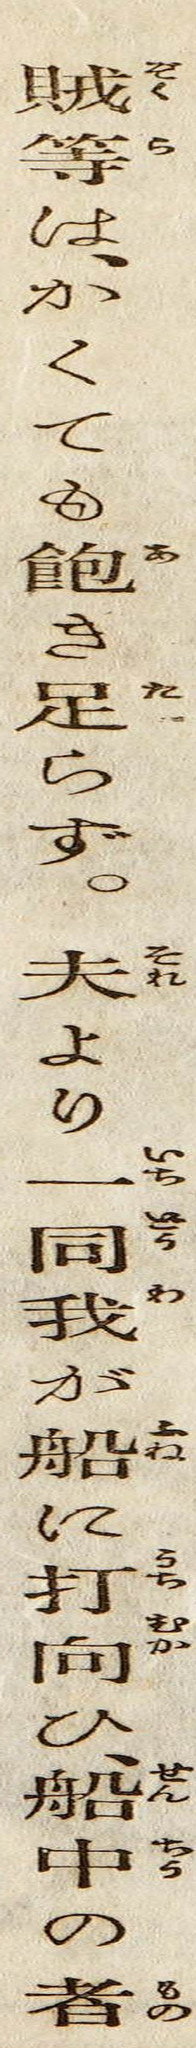賊等は、かくても飽き足らず。夫より一同我が船に打向ひ、船中の者
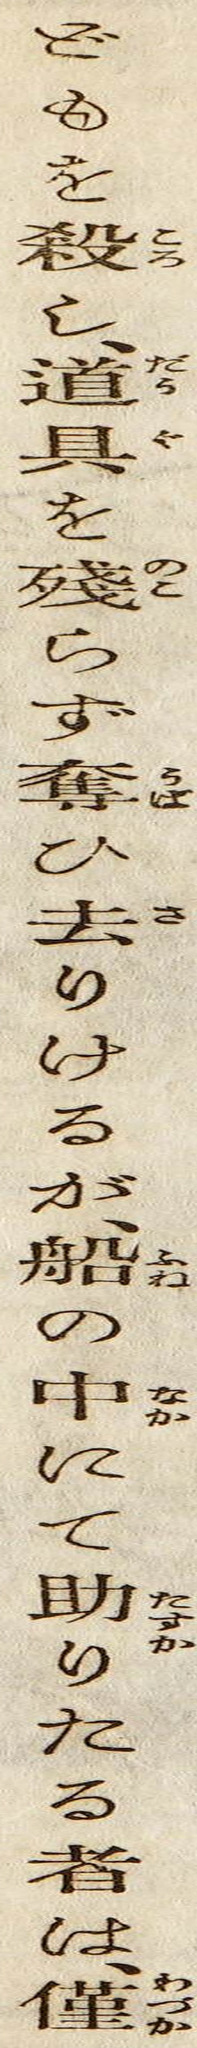どもを殺し、道具を残らず奪ひ去りけるが、船の中にて助りたる者は、僅
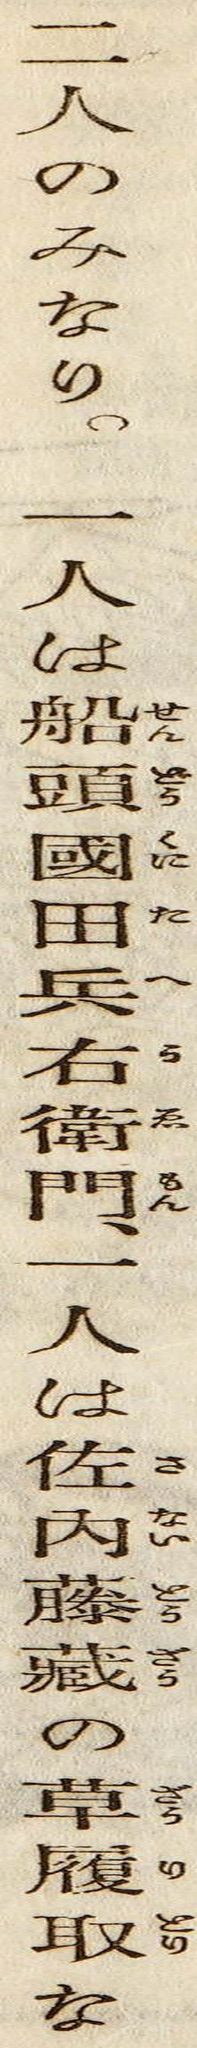二人のみなり。一人は船頭国田兵右衛門、一人は佐内藤蔵の草履取な
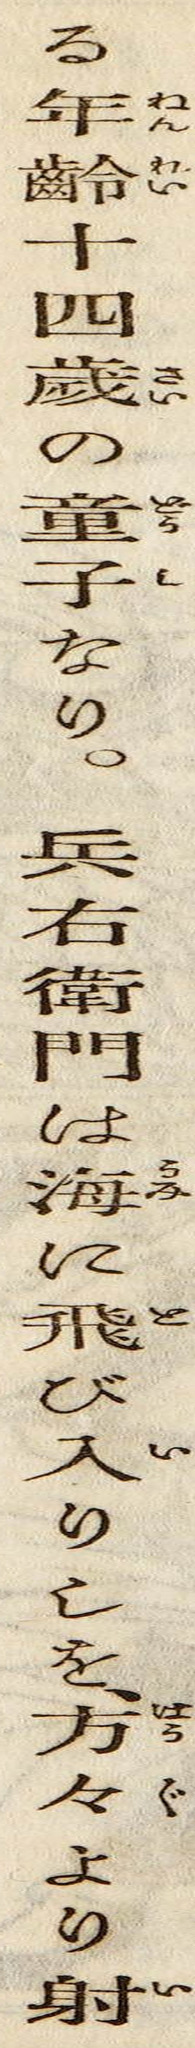る年齢十四歳の童子なり。兵右衛門は海に飛び入りしを、方々より射
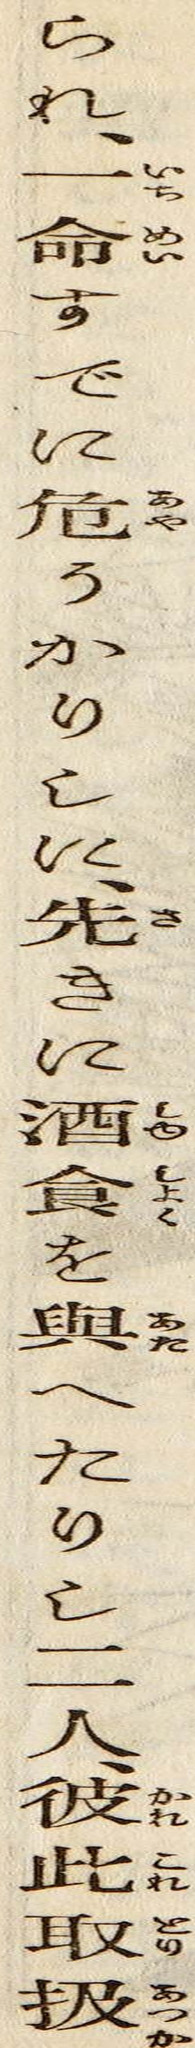られ、一命すでに危うかりしに、先きに酒食を与へたりし二人、彼此取扱
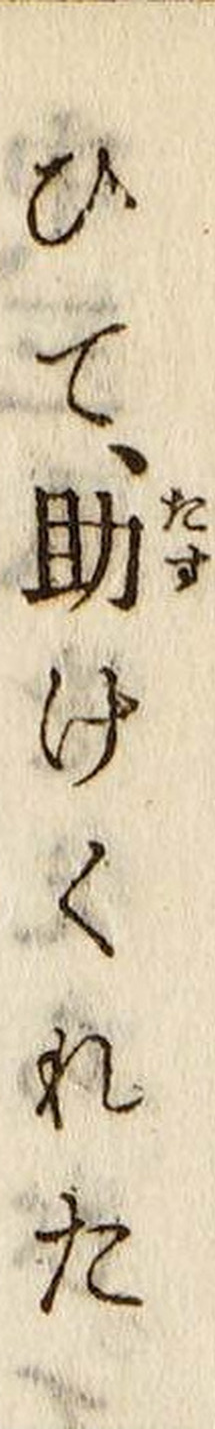ひて、助けくれた
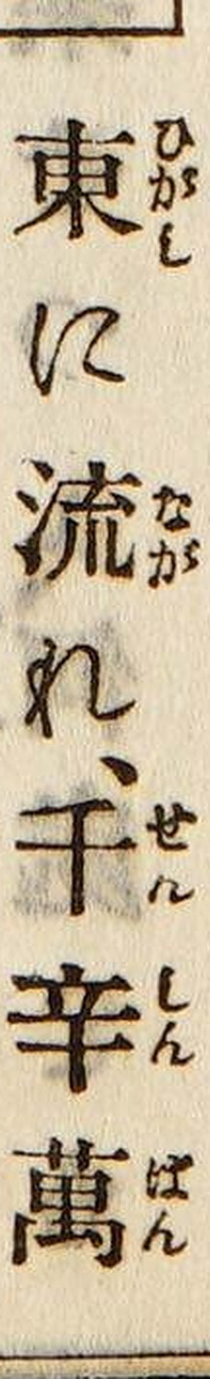東に流れ、千辛万
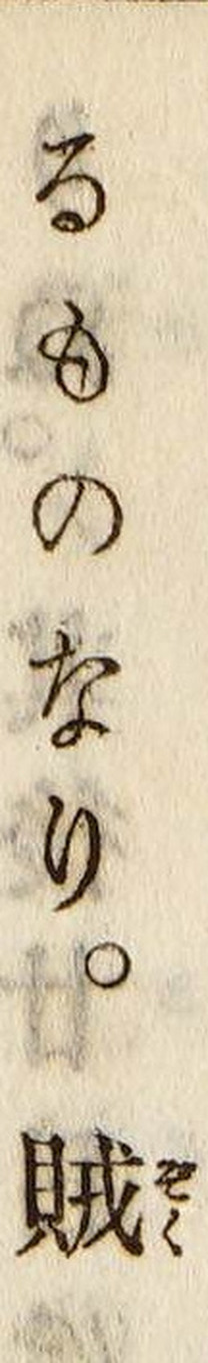るものなり。賊
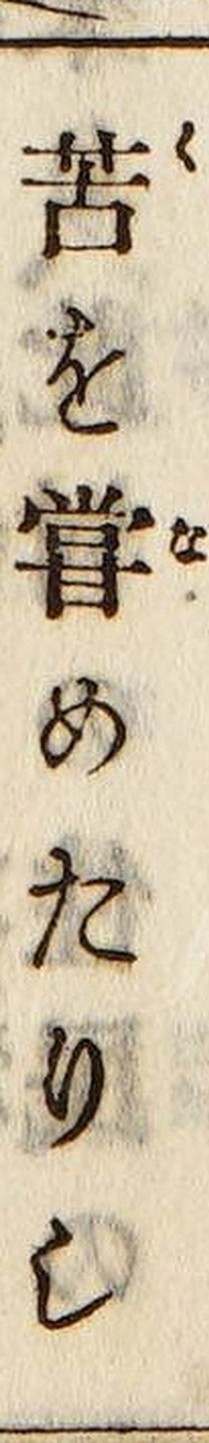苦を嘗めたりし
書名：日本漂流譚
